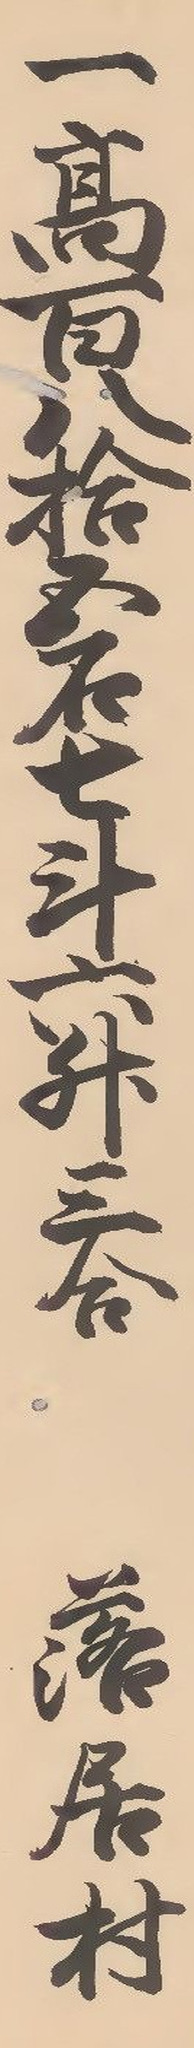一高百八拾五石七斗六升三合落居村

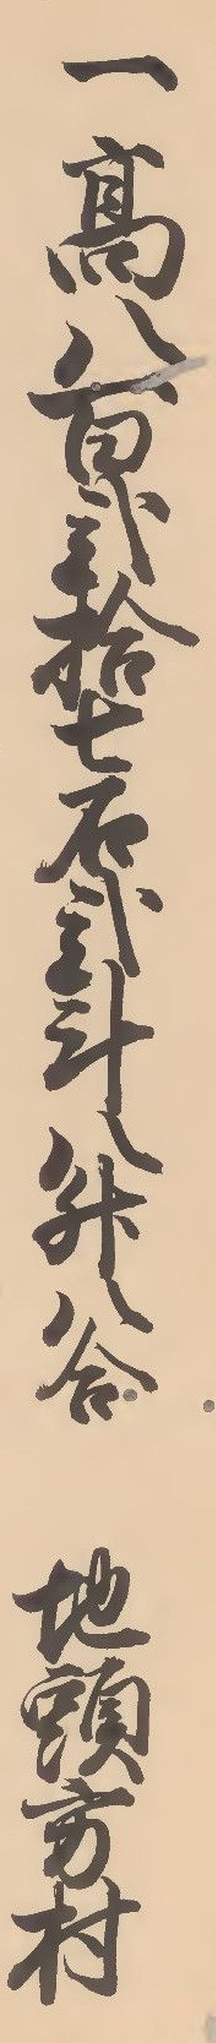一高八百弐拾七石弐斗八升八合地頭方村
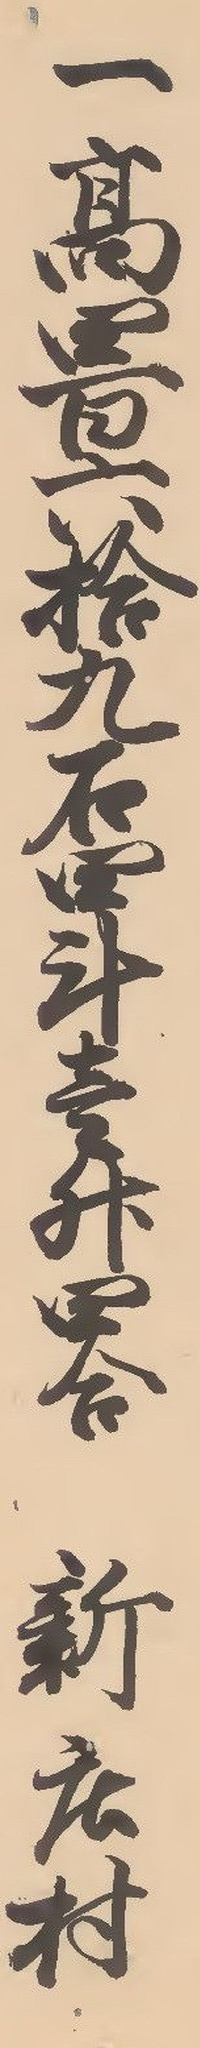一高四百六拾九石四斗壱升四合新庄村
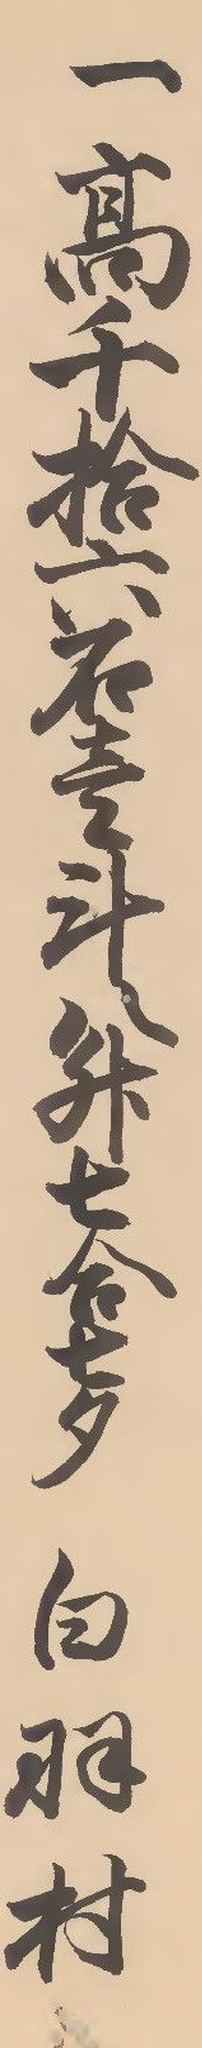一高千拾六石壱斗八升七合七勺白羽村
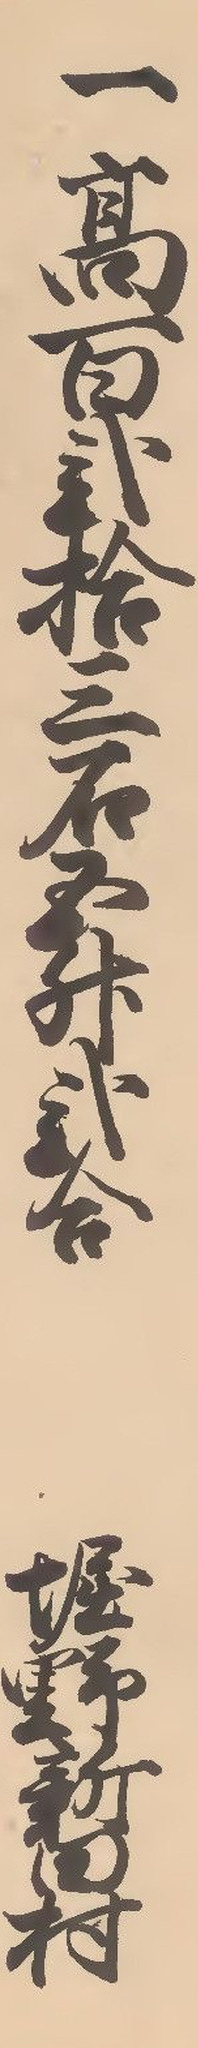一高百弐拾三石五升弐合堀野新田村
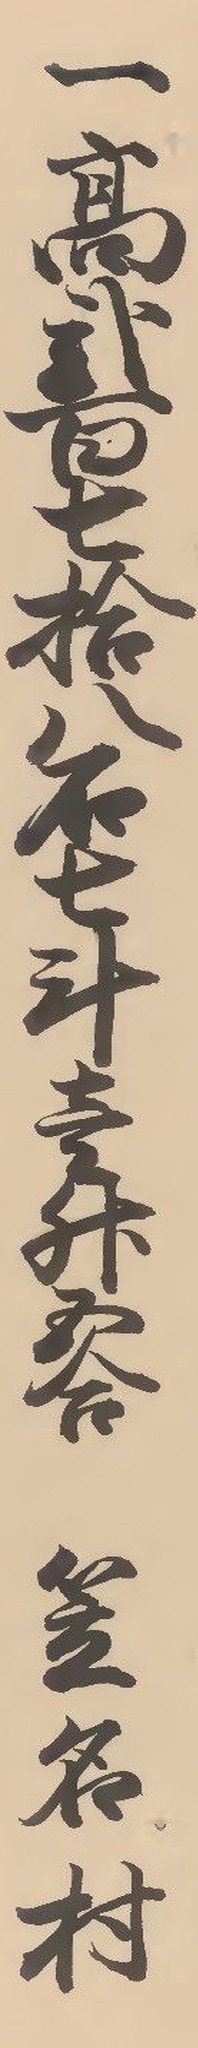一高弐百七拾八石七斗壱升五合笠名村
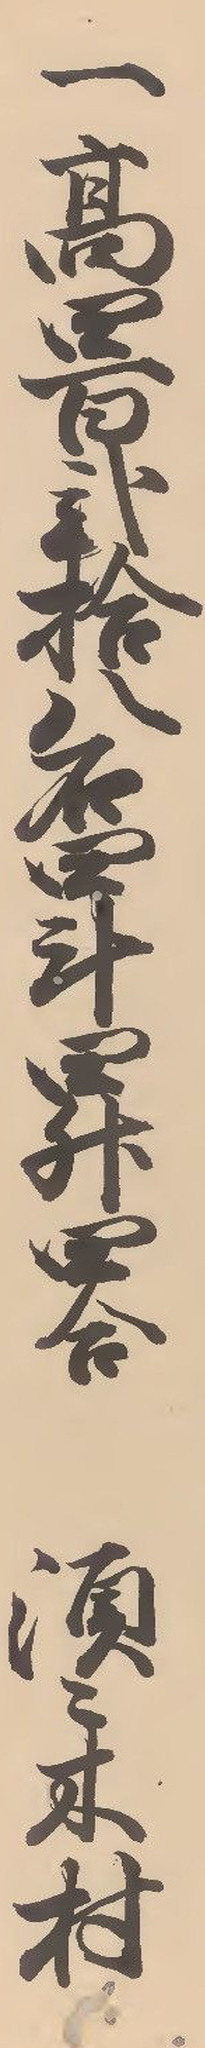一高四百弐拾八石四斗四升四合須々木村
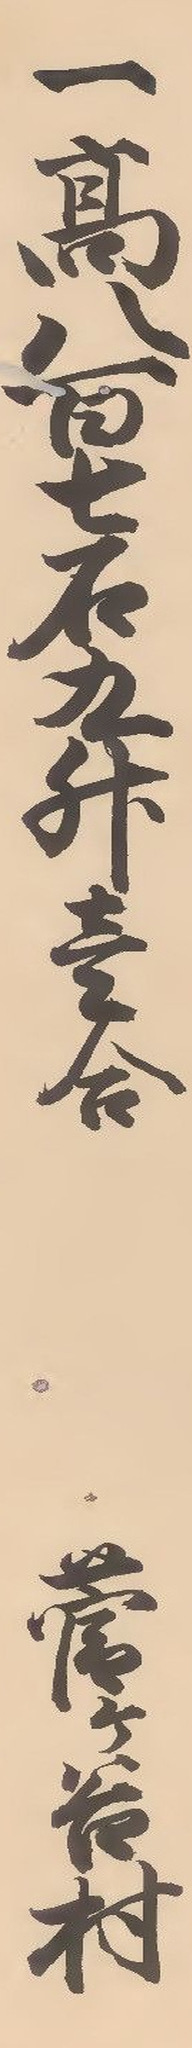一高八百七石九升壱合菅ヶ谷村

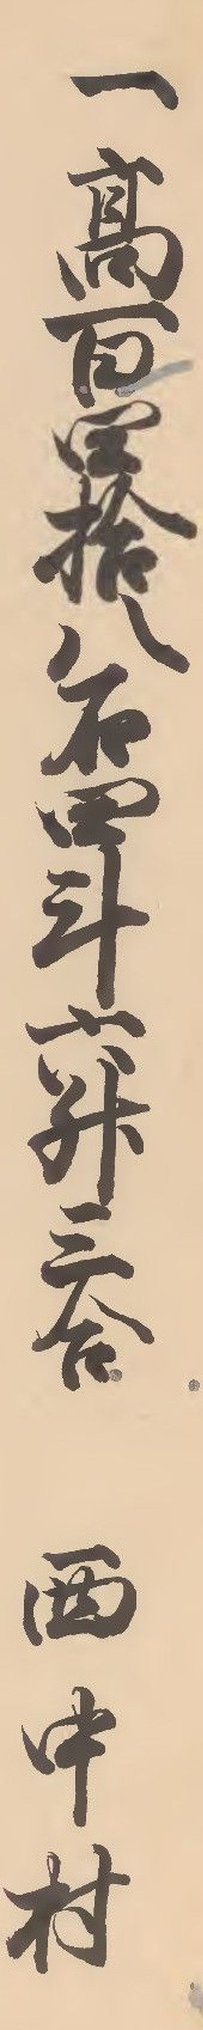一高百四拾八石四斗六升三合西中村
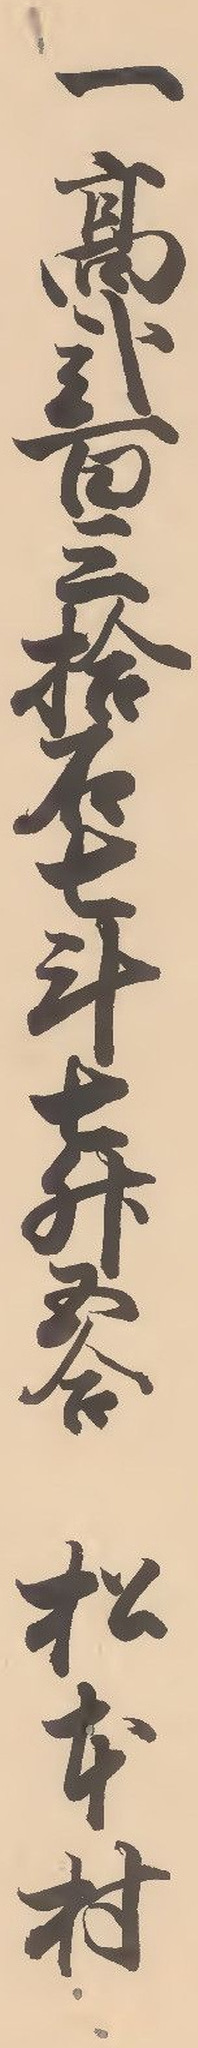一高弐百三拾石七斗七升五合松本村
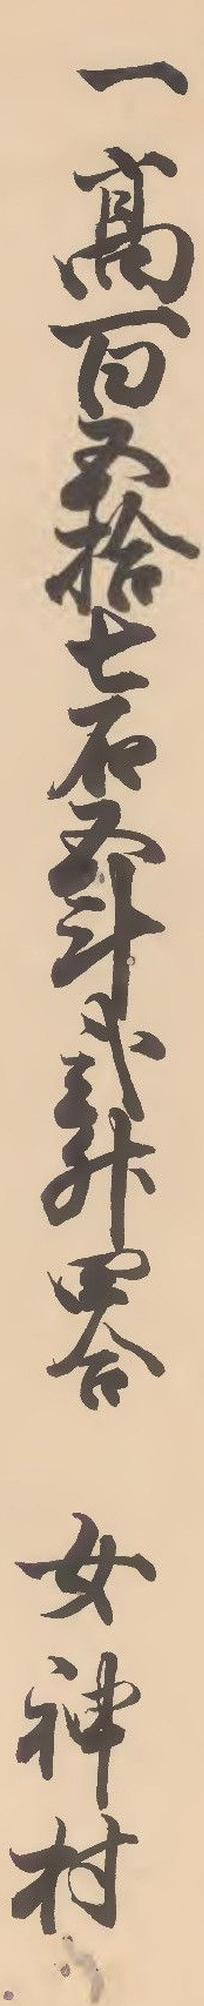一高百五拾七石五斗弐升四合女神村
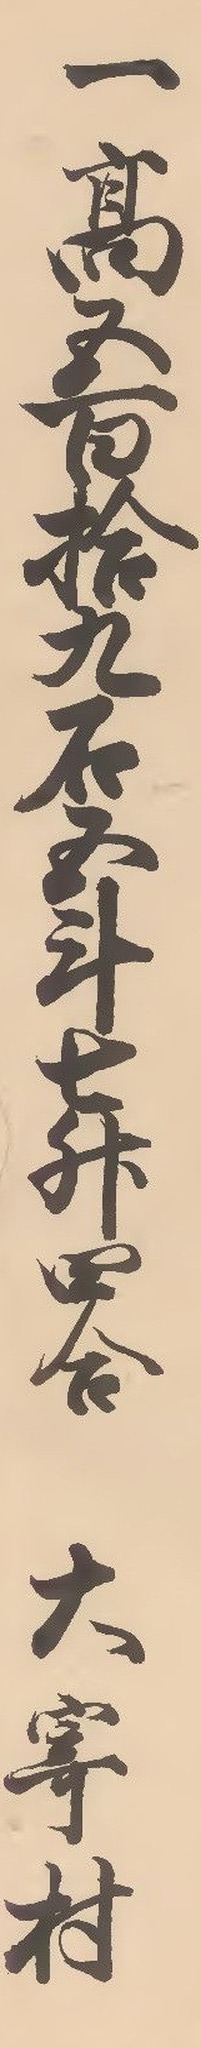一高五百拾九石五斗七升四合大寄村
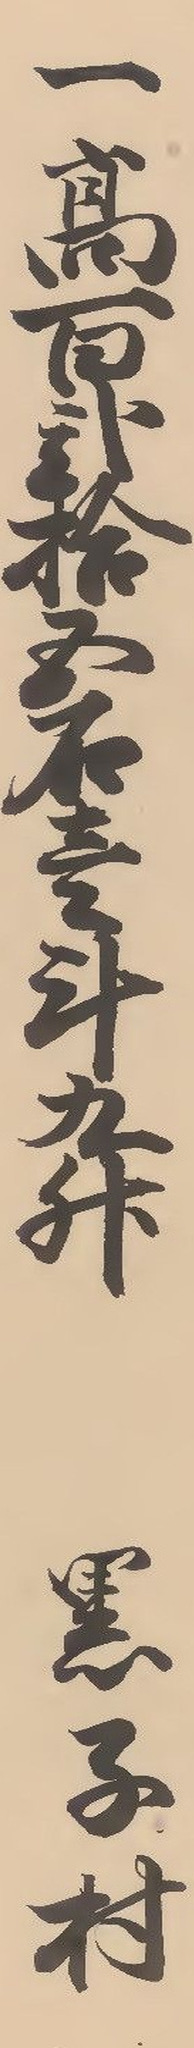一高百弐拾五石壱斗九升黒子村
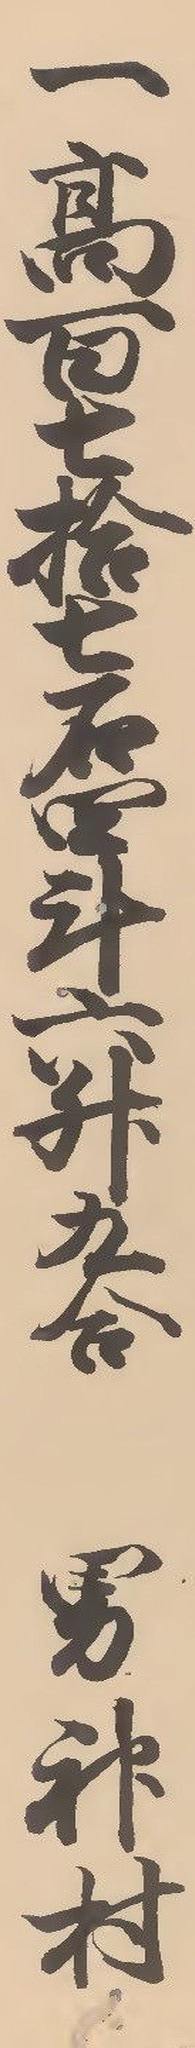一高百七拾七石四斗六升九合男神村
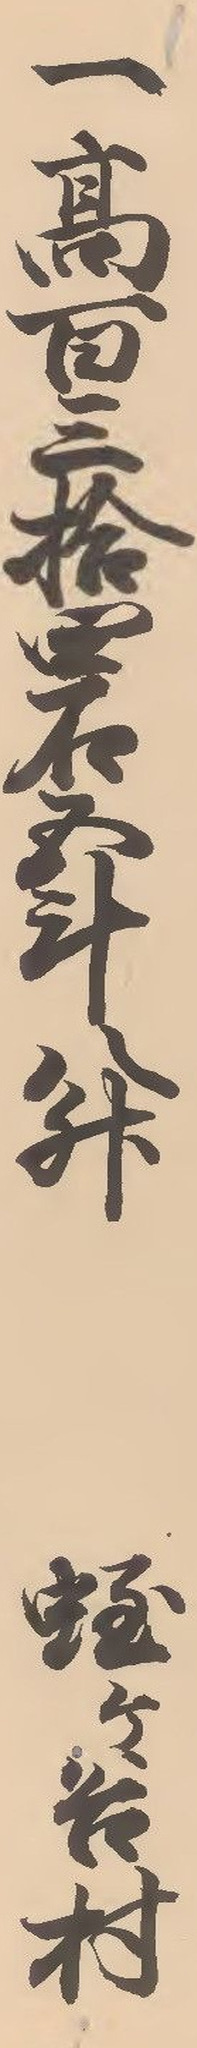一高百三拾四石五斗八升蛭ヶ谷村
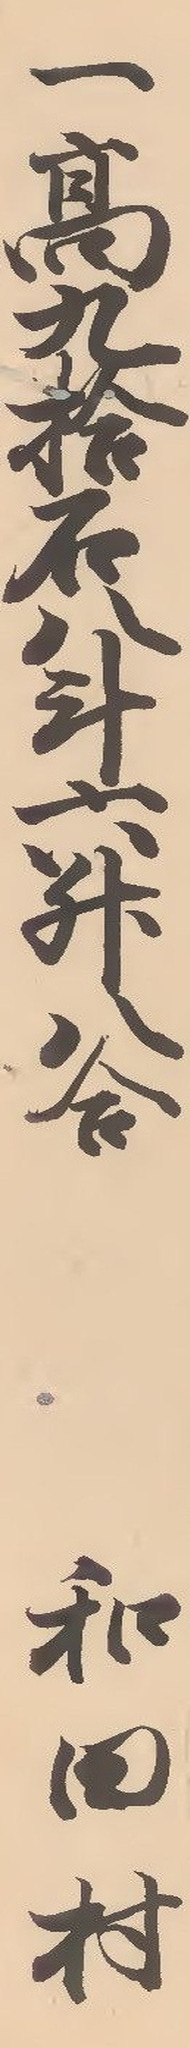一高九拾石八斗六升八合和田村
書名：遠江国郷帳
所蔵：国立公文書館 National Archives of Japan
